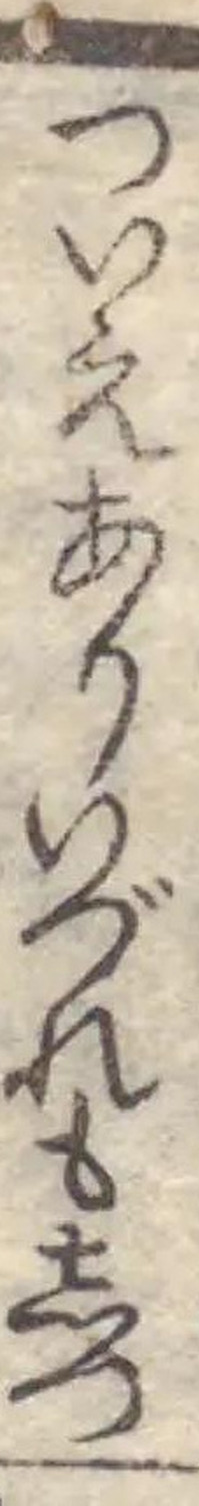ついえありいづれもしつ
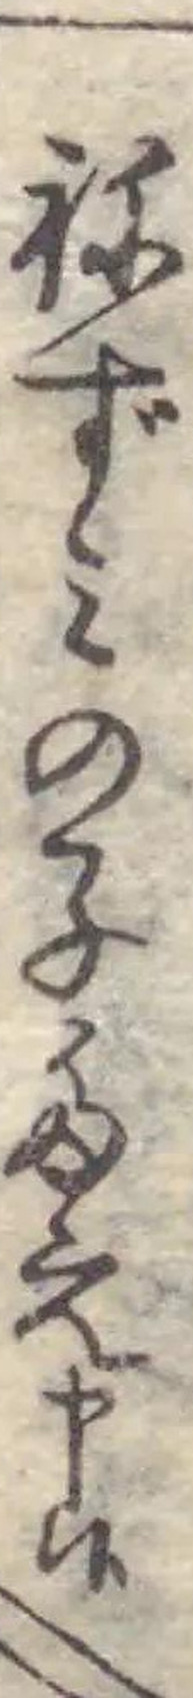ねずみの子たえ申候
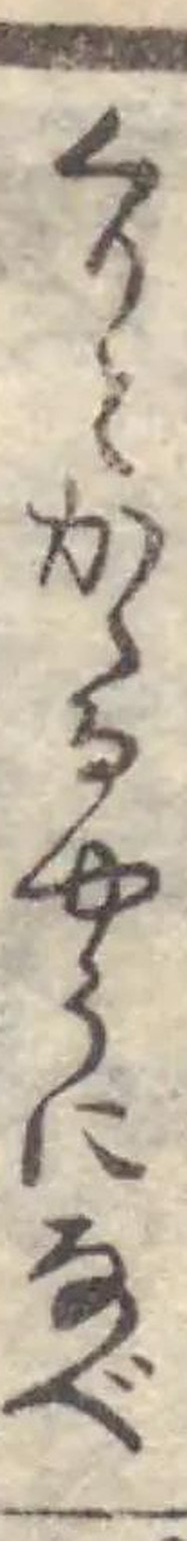くりとかゝるやうになべ
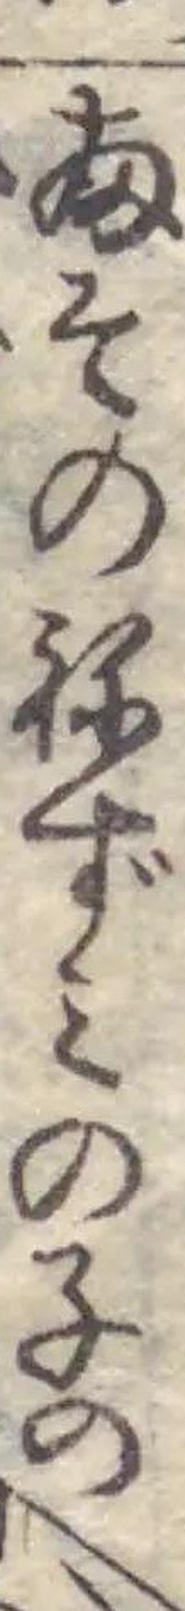扨そのねずみの子の
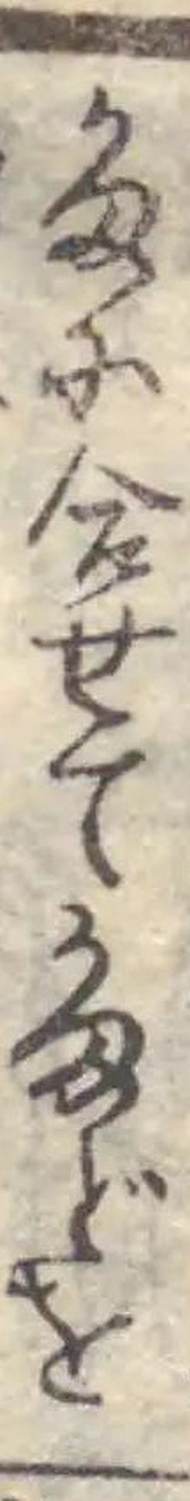かまに合せてかまどを
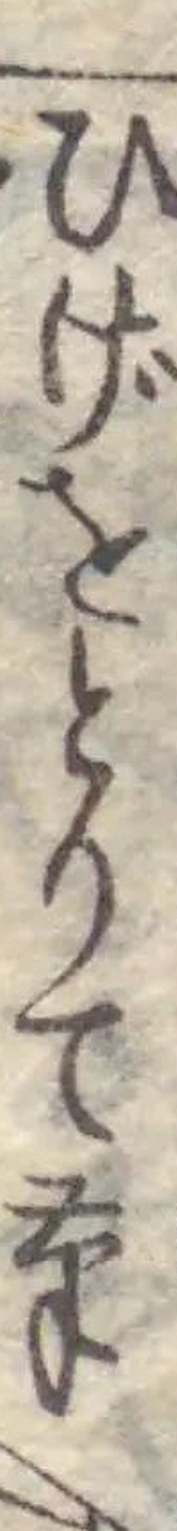ひげをとりて筆
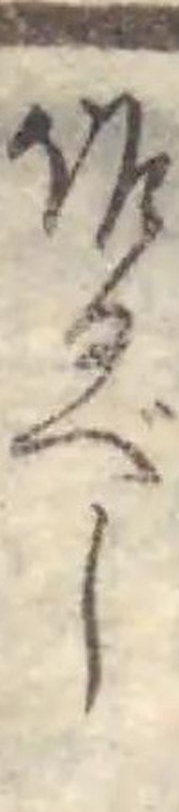作るべし
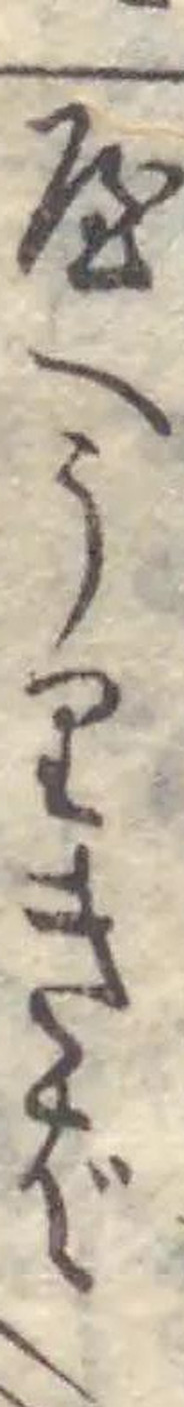屋へうりきば
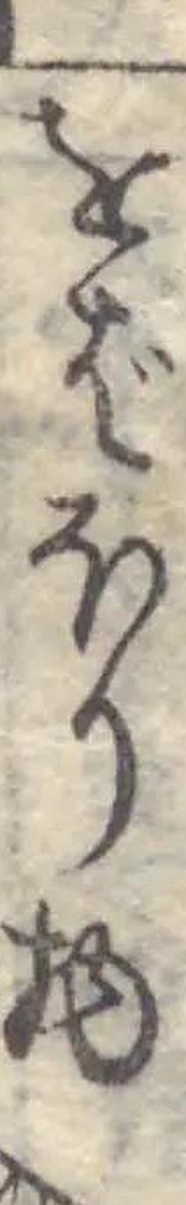をばほり物
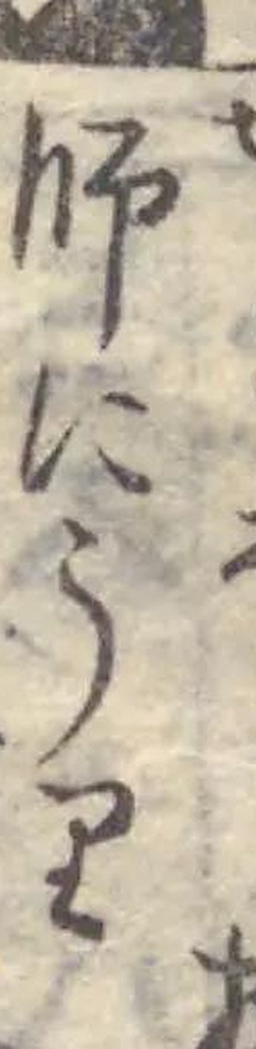師にうり
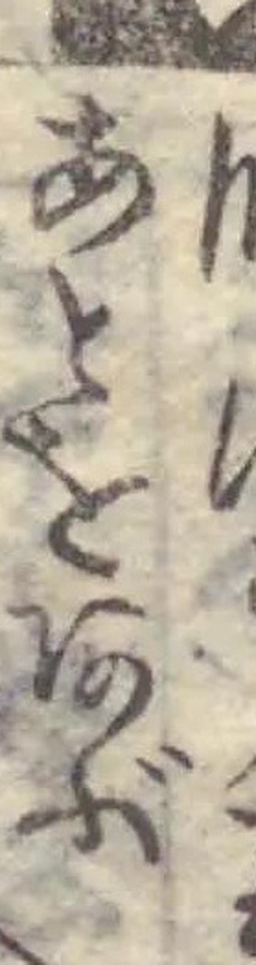あとをあぶ
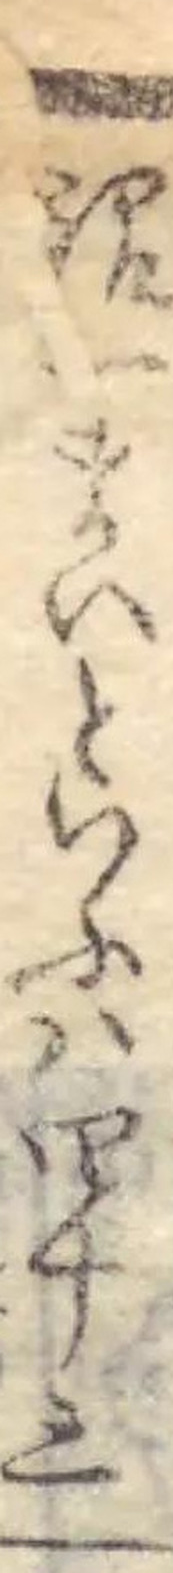銀一まいといふは四十三
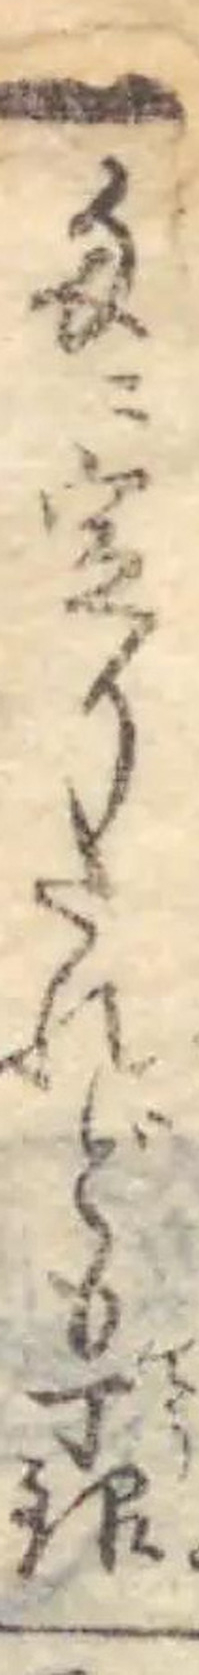匁に定まりされども丁銀
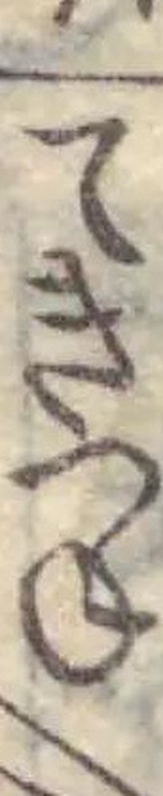てきつね
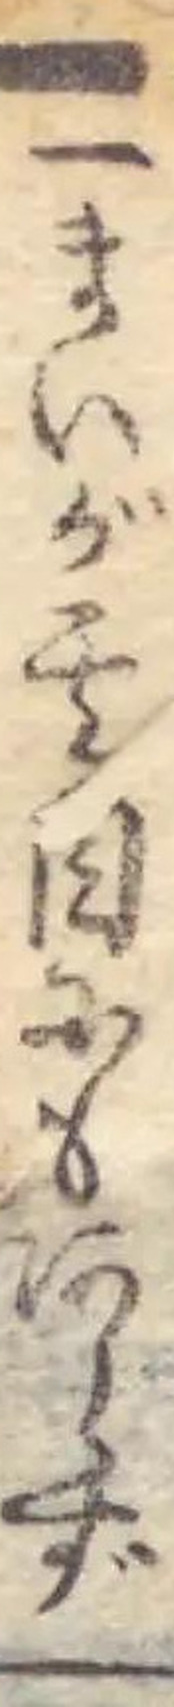一まいが其目にもあらず
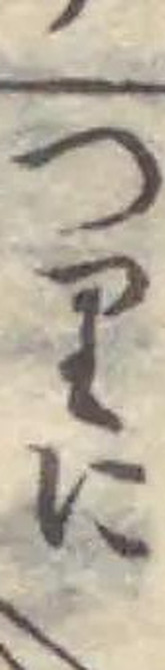つりに
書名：大通人好記
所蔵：国立国会図書館 National Diet Library, JAPAN
